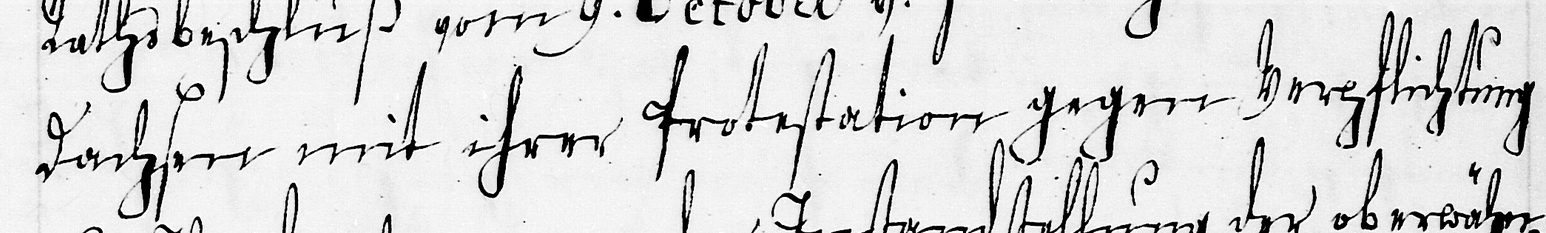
Dachsen mit ihrer Protestation gegen Verpflichtung
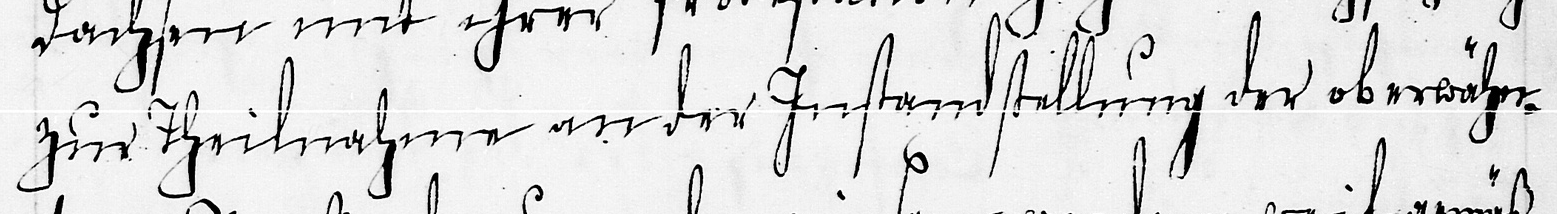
zur Theilnahme an der Instandstellung der oberwähn¬
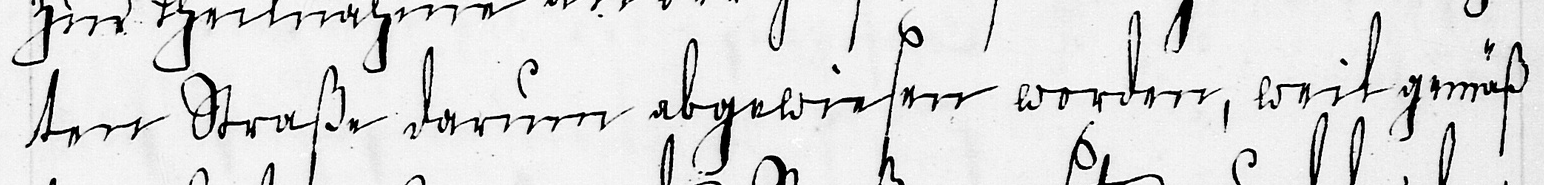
ten Straße darum abgewiesen worden, weil gemäß
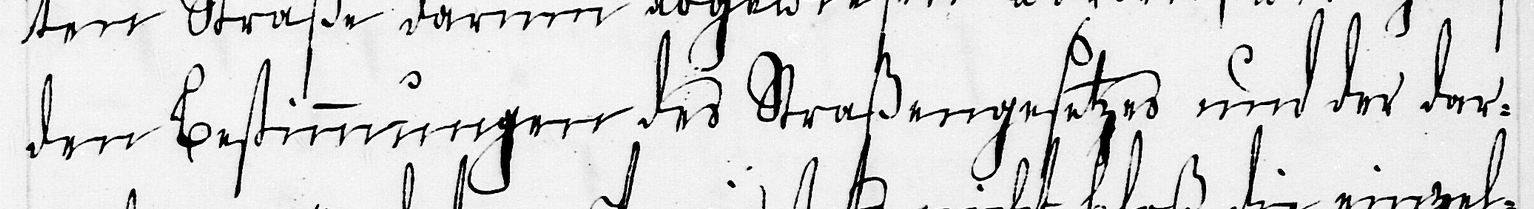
den Bestimmungen des Straßengesetzes und der dar¬
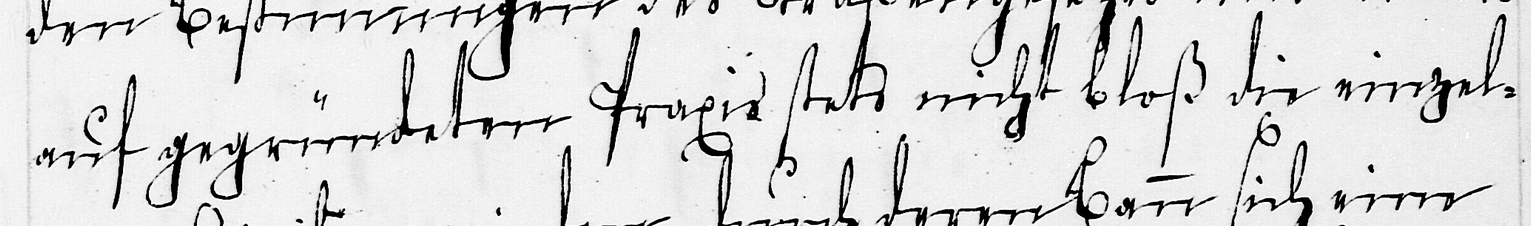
auf gegründeten Praxis stets nicht bloß die einzel¬
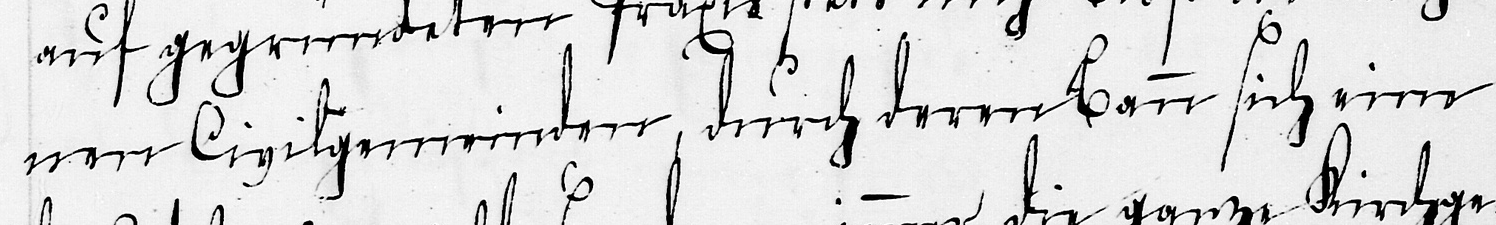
nen Civilgemeinden, durch deren Bau sich eine
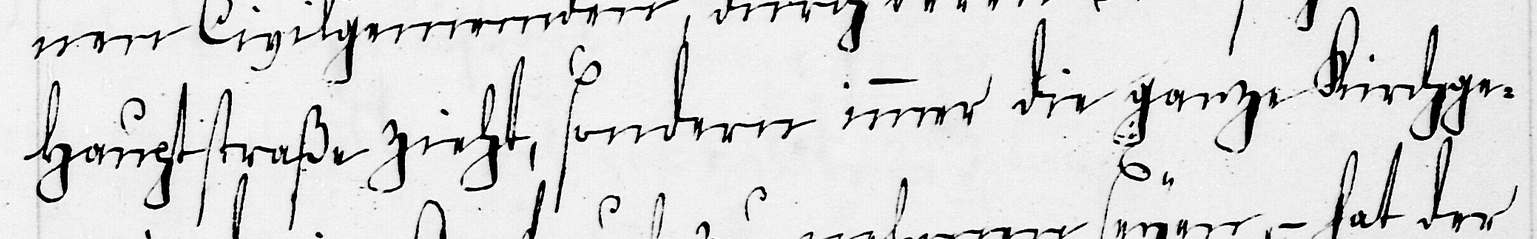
Hauptstraße zieht, sondern immer die ganze Kirchge¬
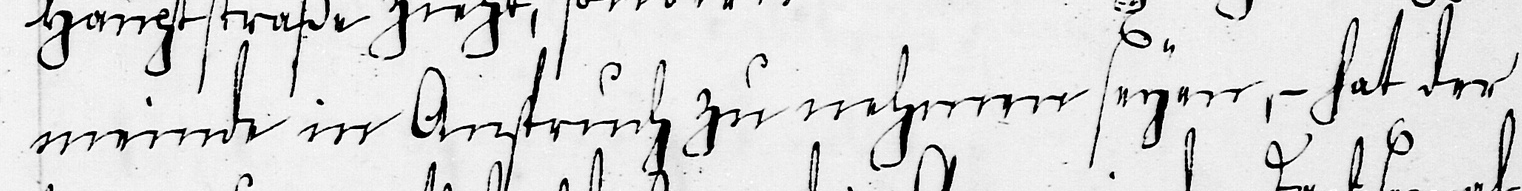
meinde in Anspruch zu nehmen seyen, – hat der
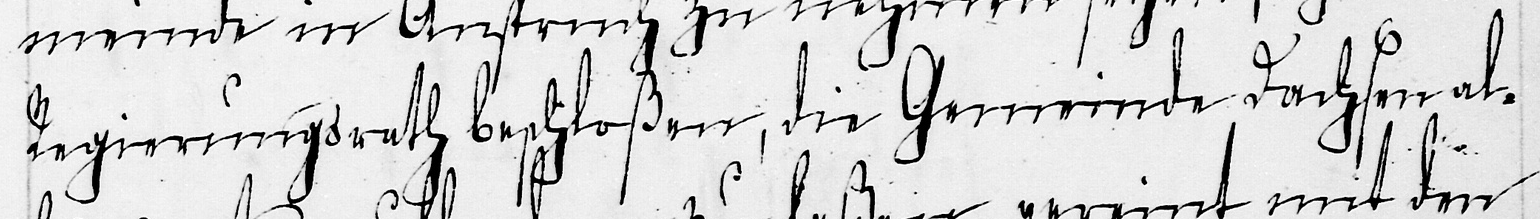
Regierungsrath beschloßen, die Gemeinde Dachsen al¬
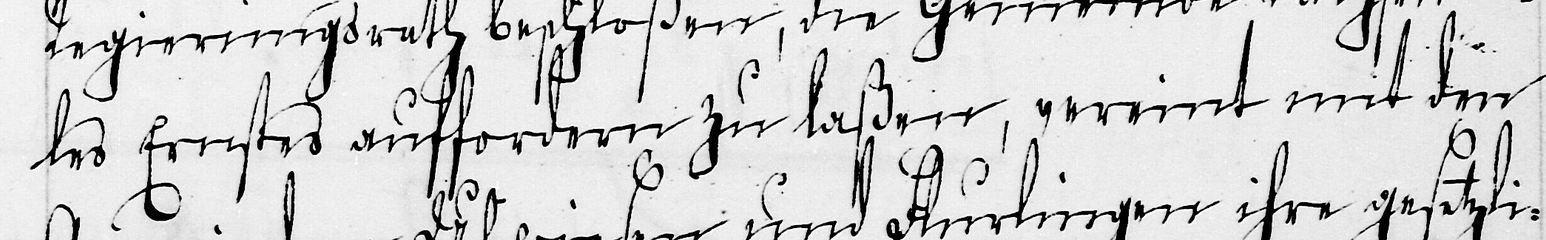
les Ernstes auffordern zu laßen, vereint mit den
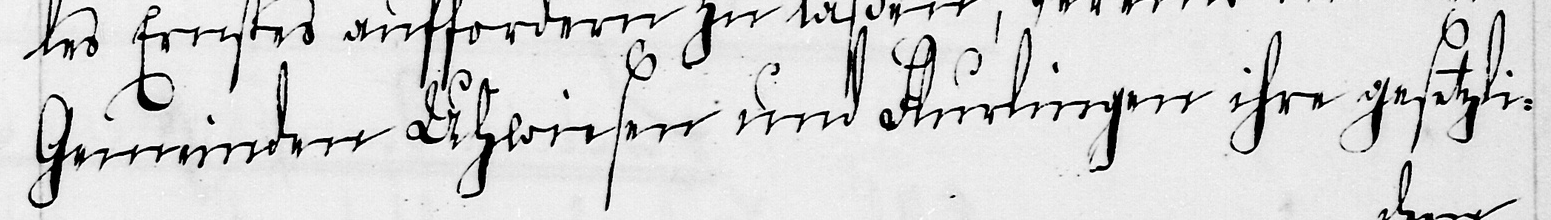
Gemeinden Uhwiesen und Flurlingen ihre gesetzl¬
